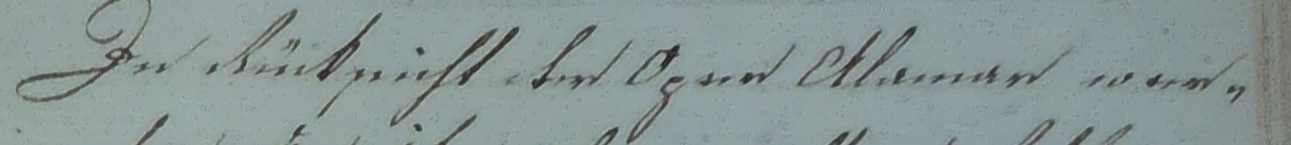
In Rücksicht der Oper Alamar wer¬
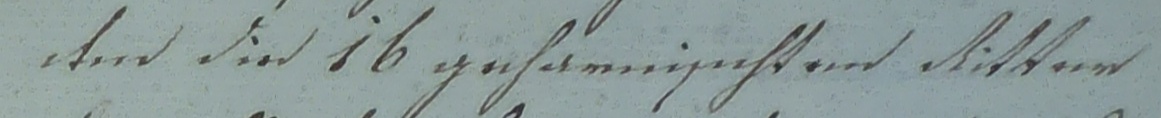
den die 16 geharnischten Ritter
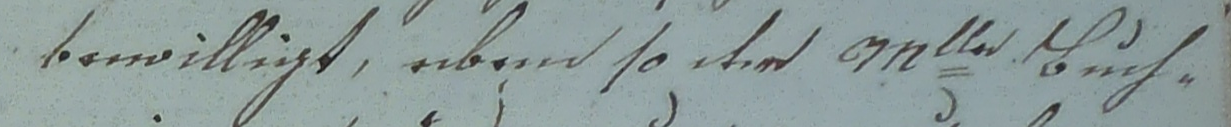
bewilligt, eben so der Mll͇e Buch¬
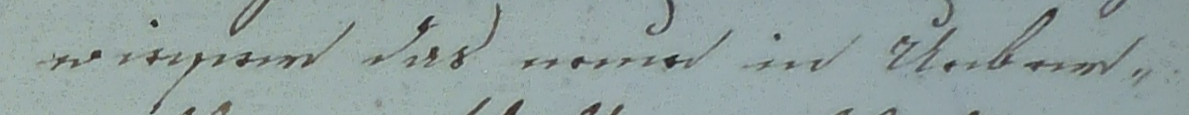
wieser das neue in Ueber¬
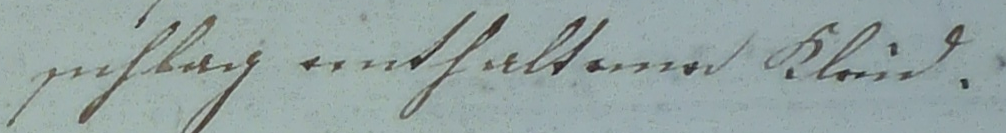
schlag enthaltene Kleid.
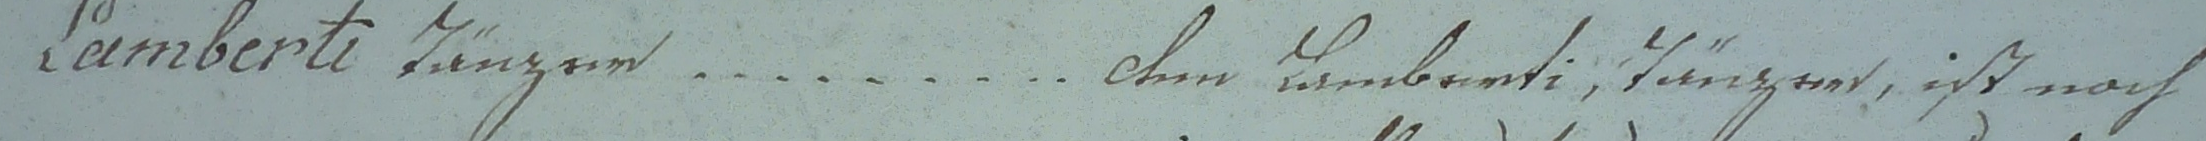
Lamberti Tänzer ……… Dem Lamberti, Tänzer, ist noch
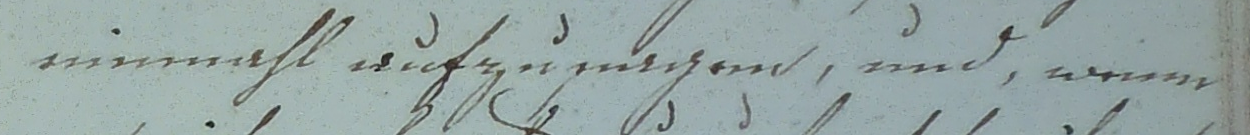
einmahl aufzusagen, und, wenn
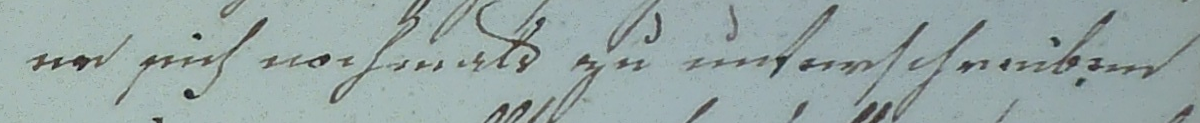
er sich nochmals zu unterschreiben
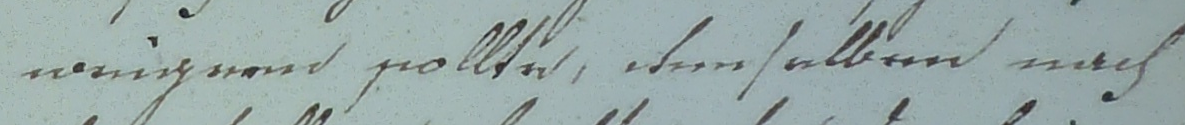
weigern sollte, demselben nach
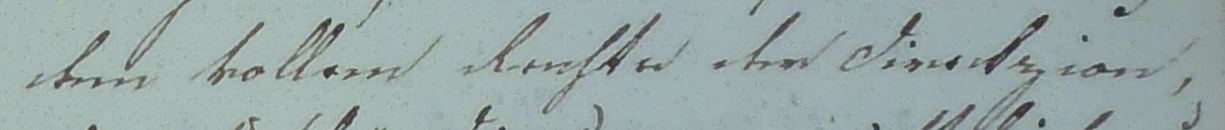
dem vollem Rechte der Direkzion,
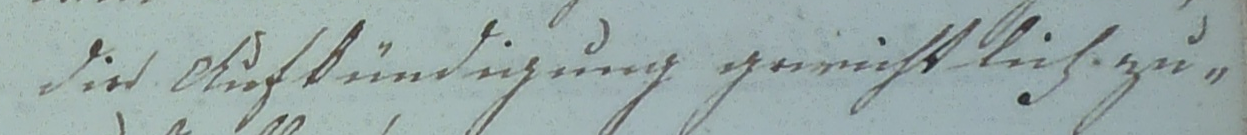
die Aufkündigung gerichtlich zu¬
